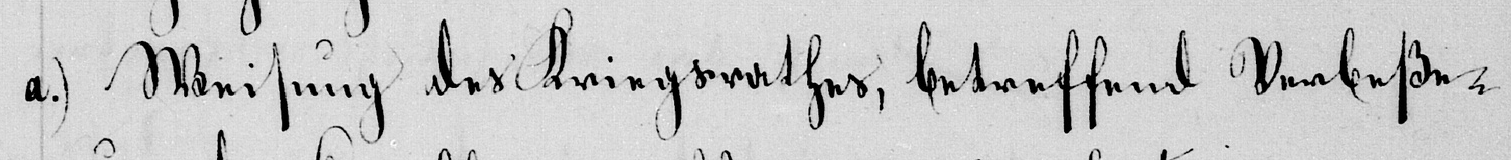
a.) Weisung des Kriegsrathes, betreffend Verbeße¬
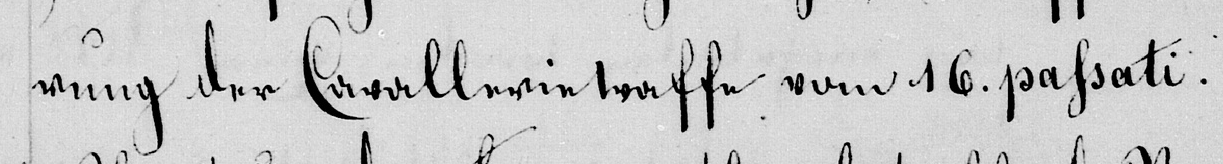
rung der Cavalleriewaffe vom 16. passati.
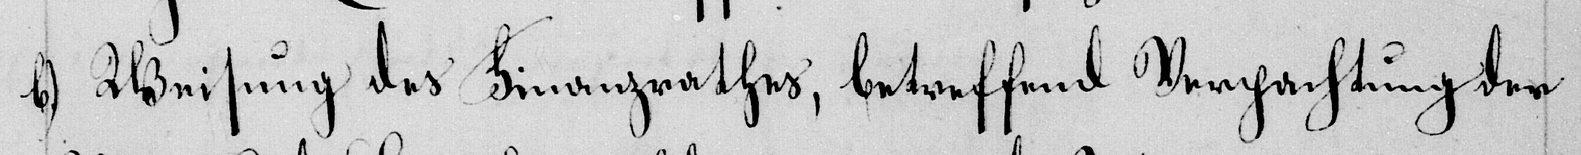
b.) Weisung des Finanzrathes, betreffend Verpachtung der
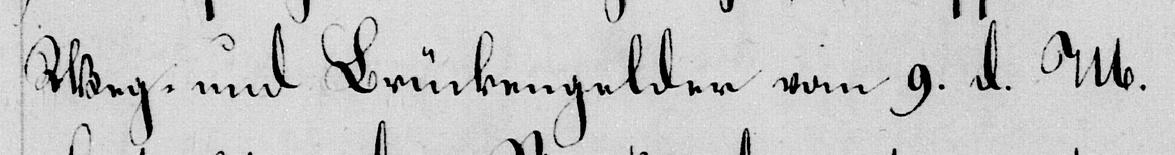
Weg- und Brückengelder vom 9. d. M.
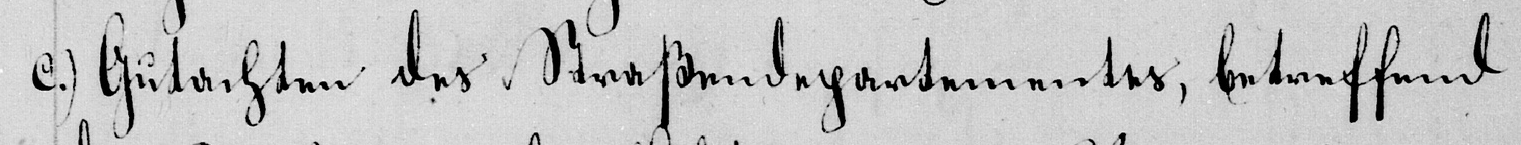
c.) Gutachten des Straßendepartements, betreffend
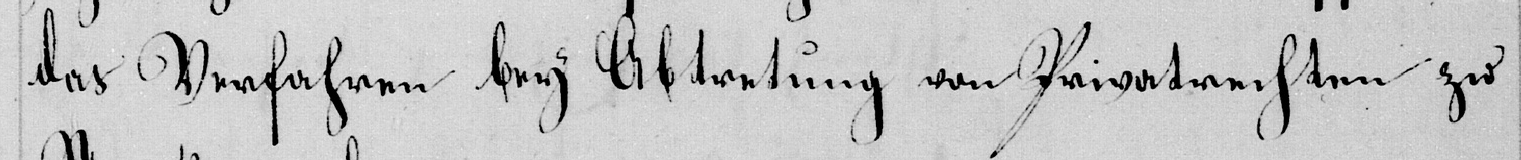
das Verfahren bey Abtretung von Privatrechten zu
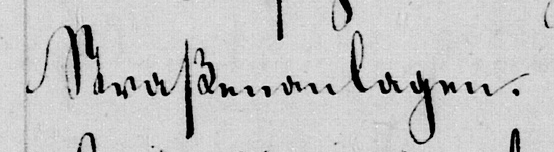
Straßenanlagen.
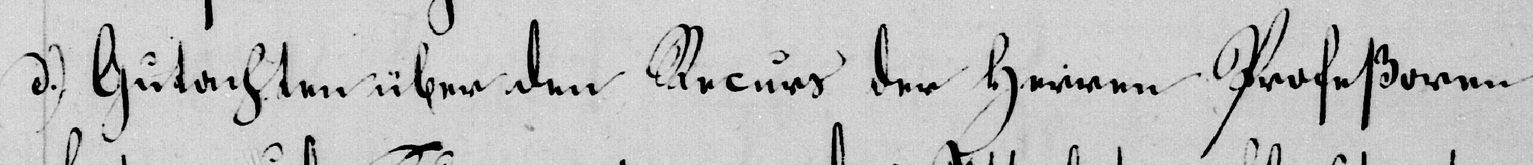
d.) Gutachten über den Recurs der Herrn Profeßoren
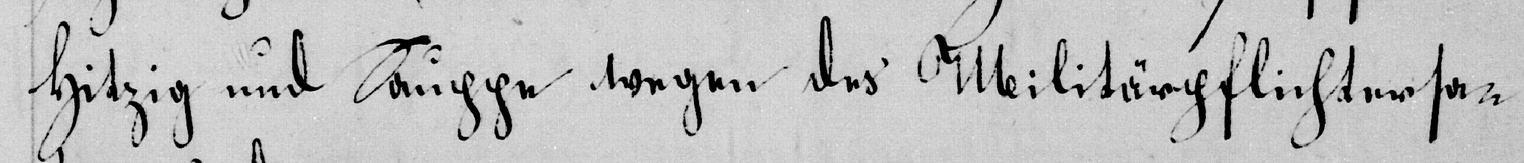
Hitzig und Sauppe wegen des Militärpflichtersa¬
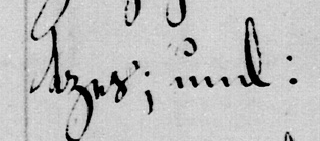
tzes, und:
